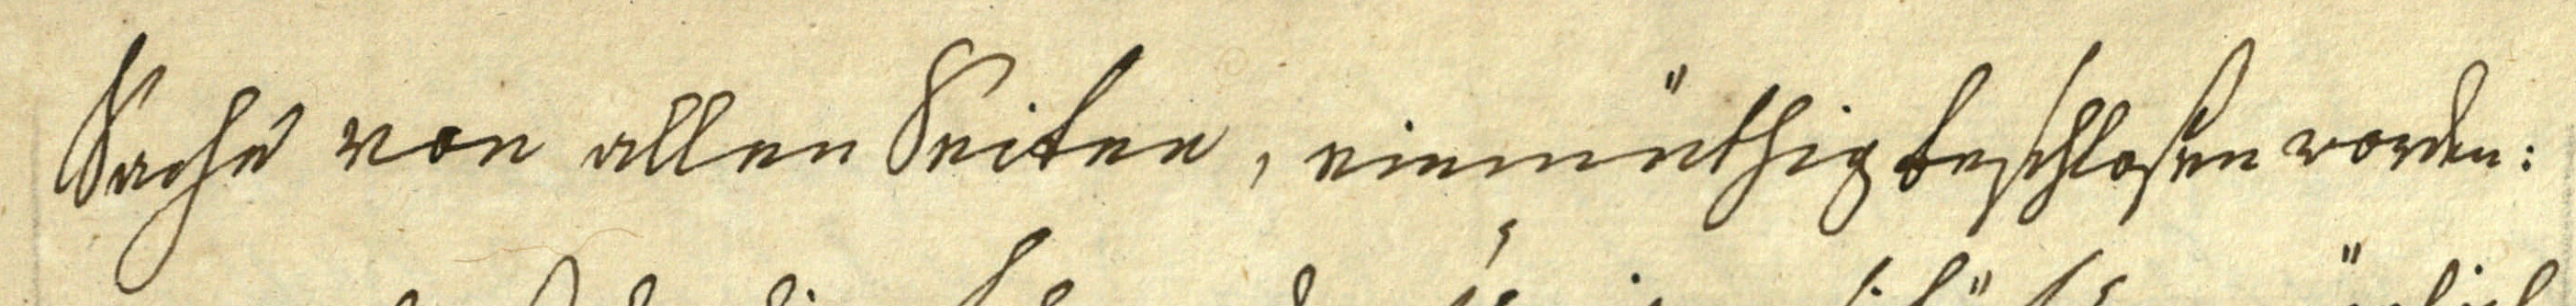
Sache von allen Seiten, einmüthig beschloßen worden:
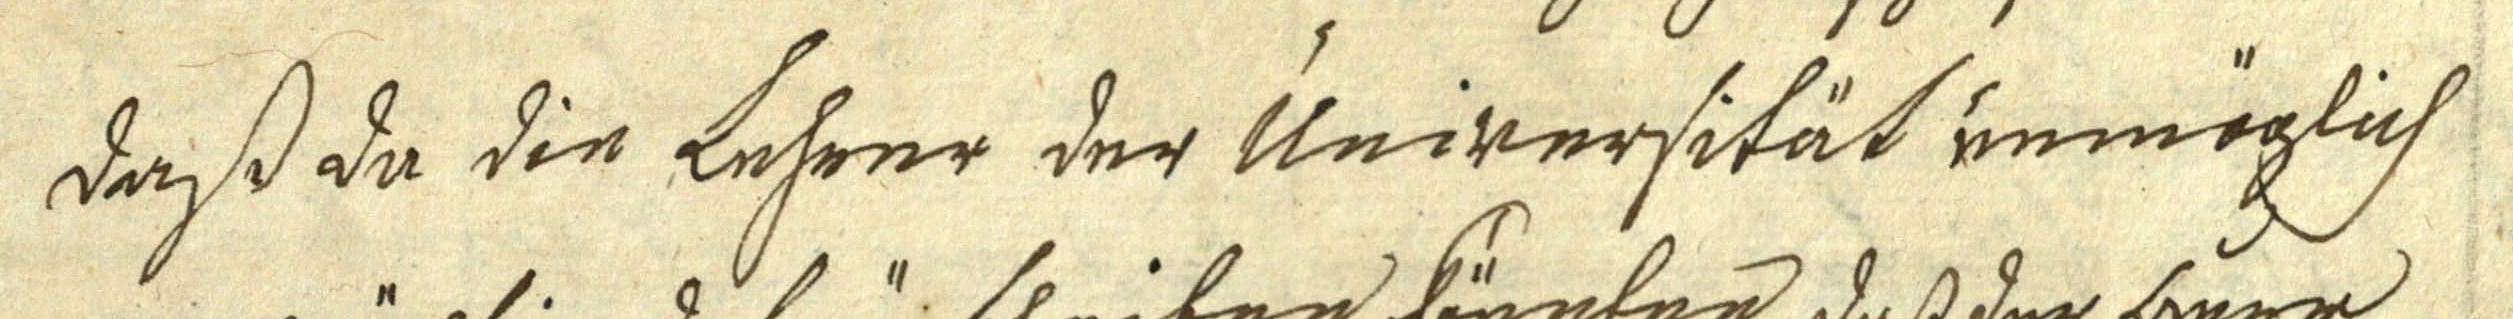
daß da die Lehrer der Universität unmöglich
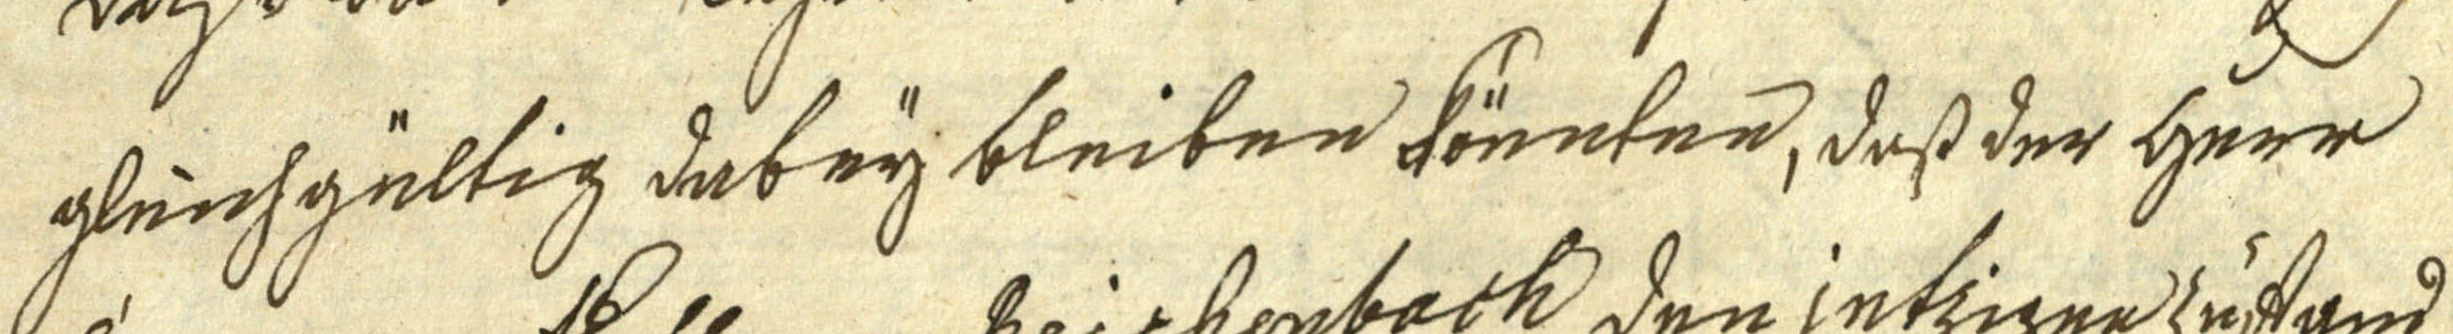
gleichgültig dabeÿ bleiben könnten, daß der Herr
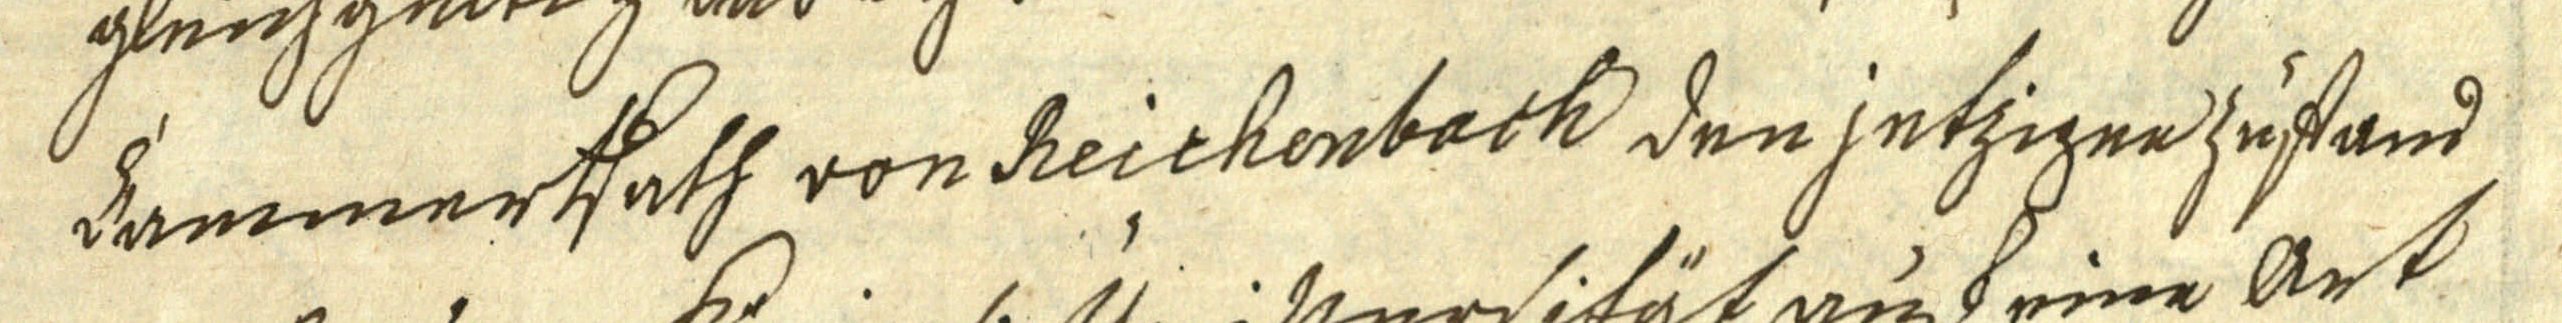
CammerRath von Reichenbach den jetzigen Zustand
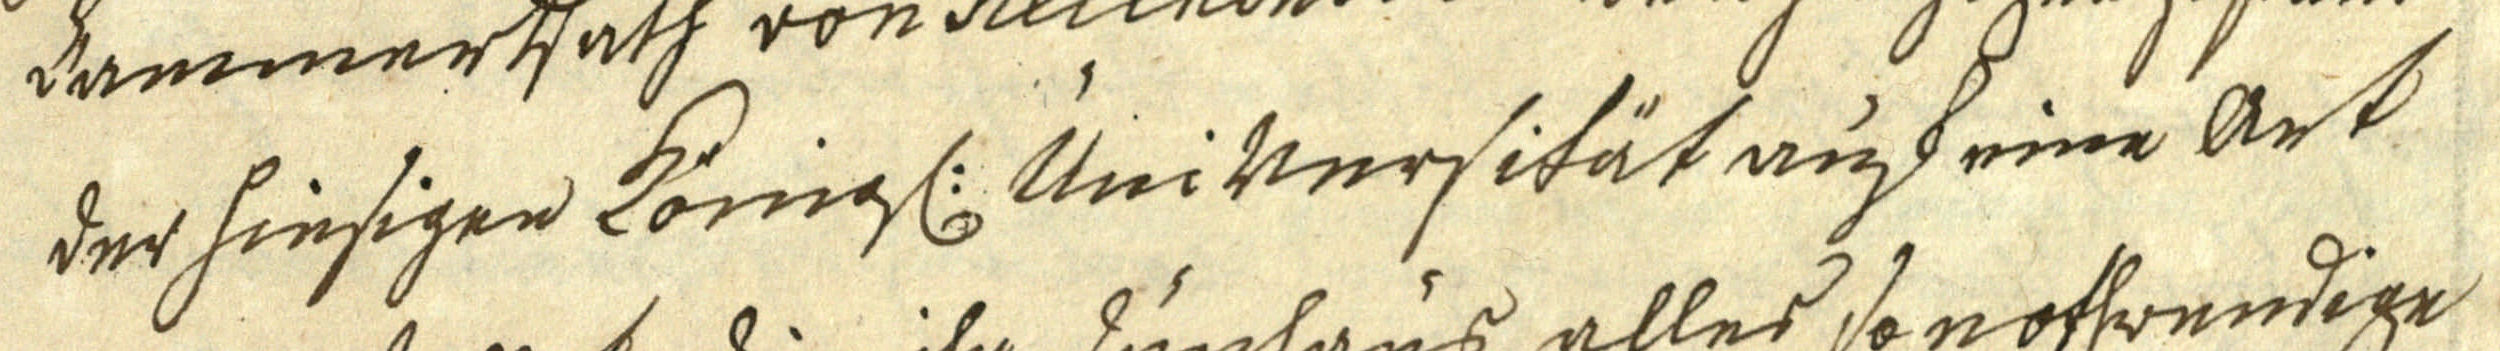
der hiesigen Königl. Universität auf eine Art
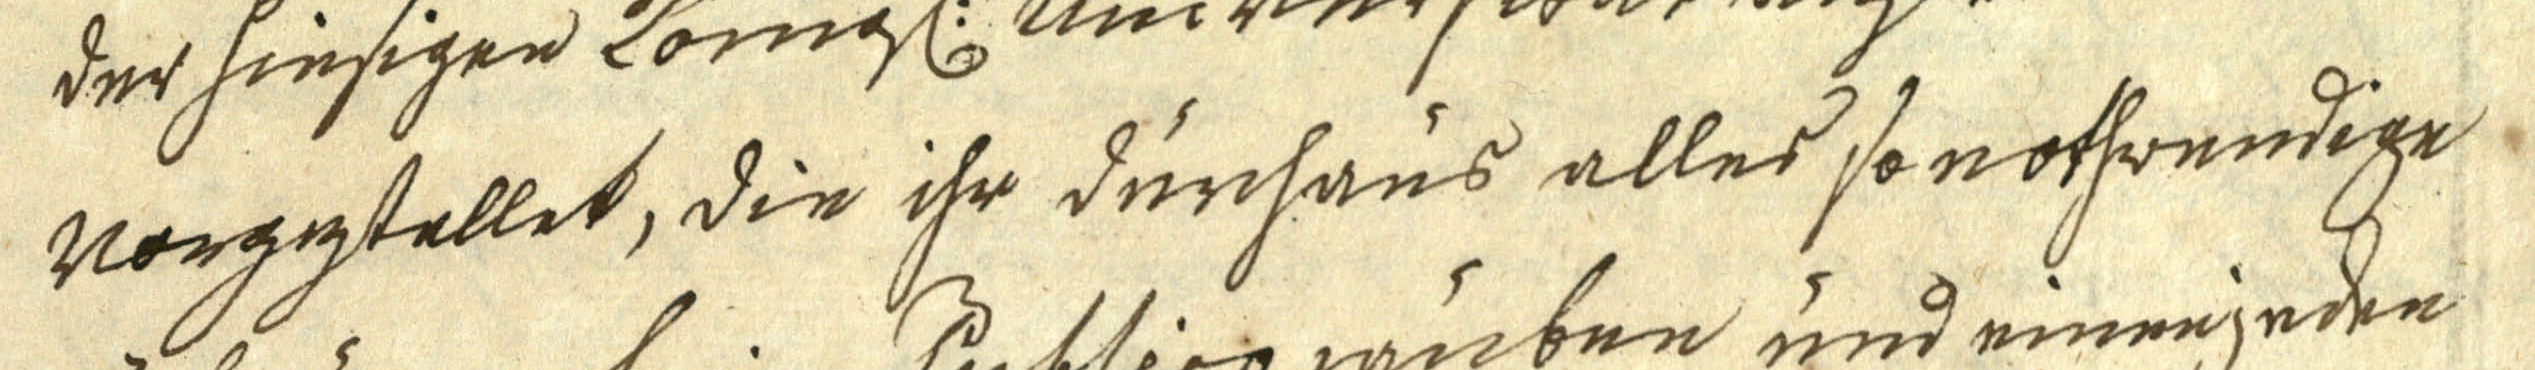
vorgestellet, die ihr durchaus alles so nothwendige
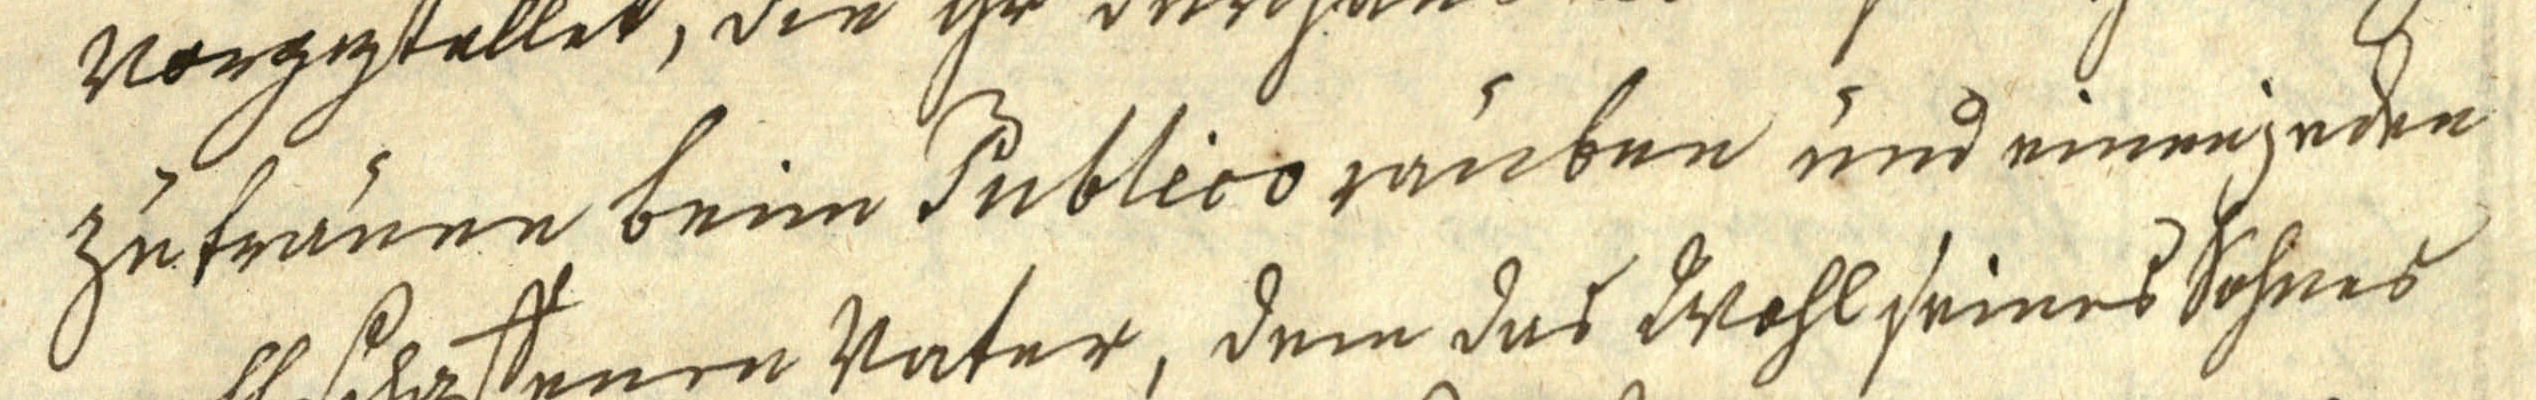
Zutrauen beim Publico rauben und einenjeden
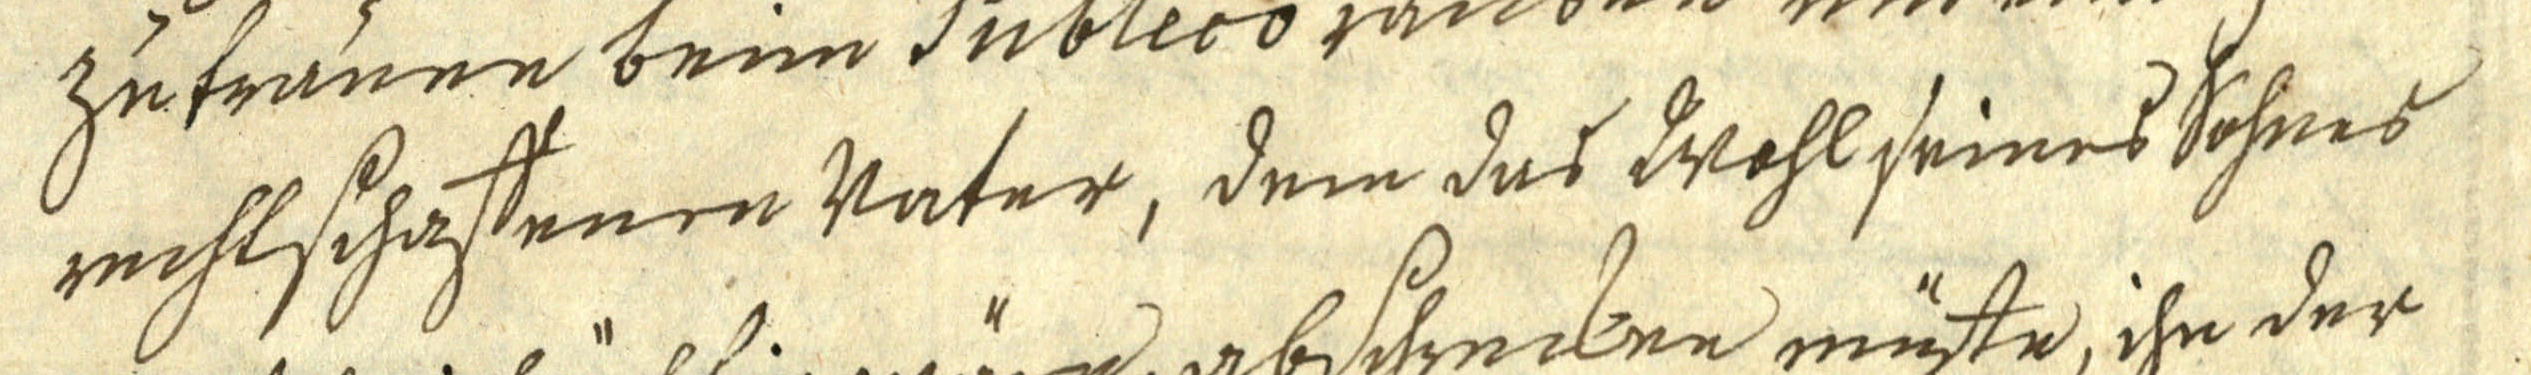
rechtschaffenen Vater, dem das Wohl seines Sohnes
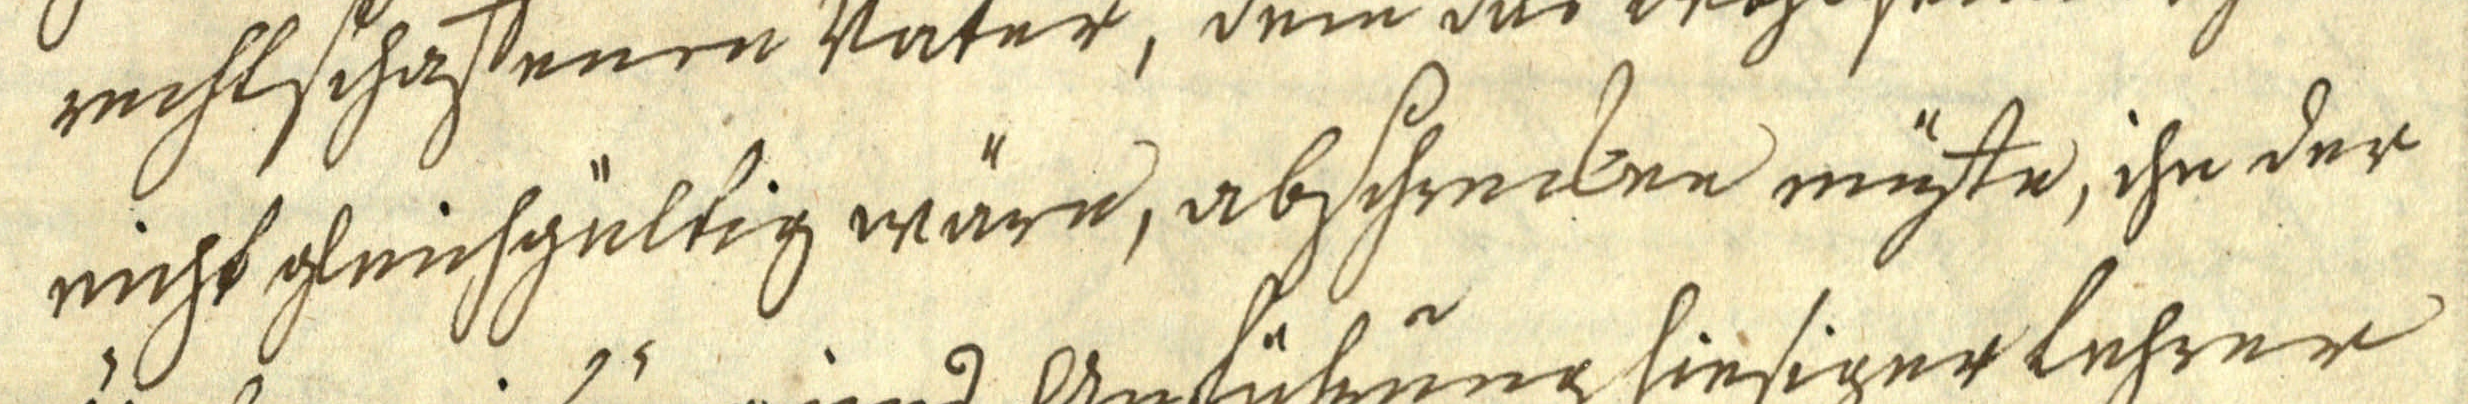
nicht gleichgültig wäre, abschrecken müste, ihn der
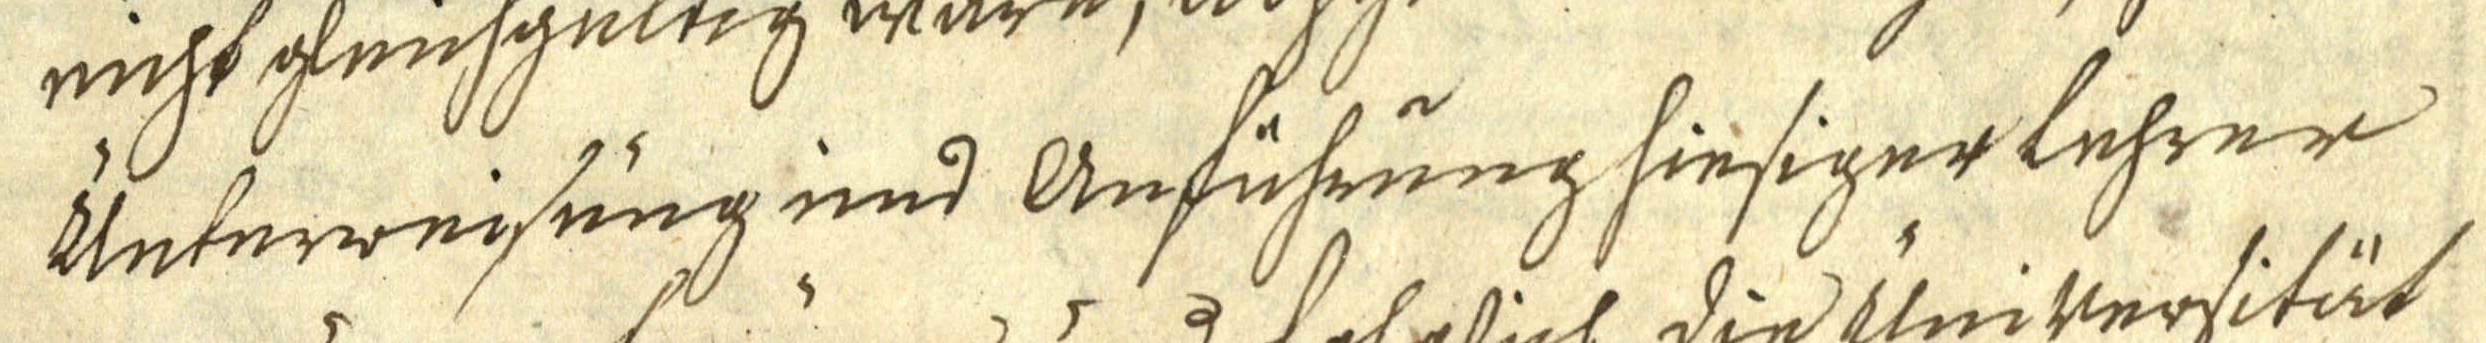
Unterweisung und Anführung hiesiger Lehrer
